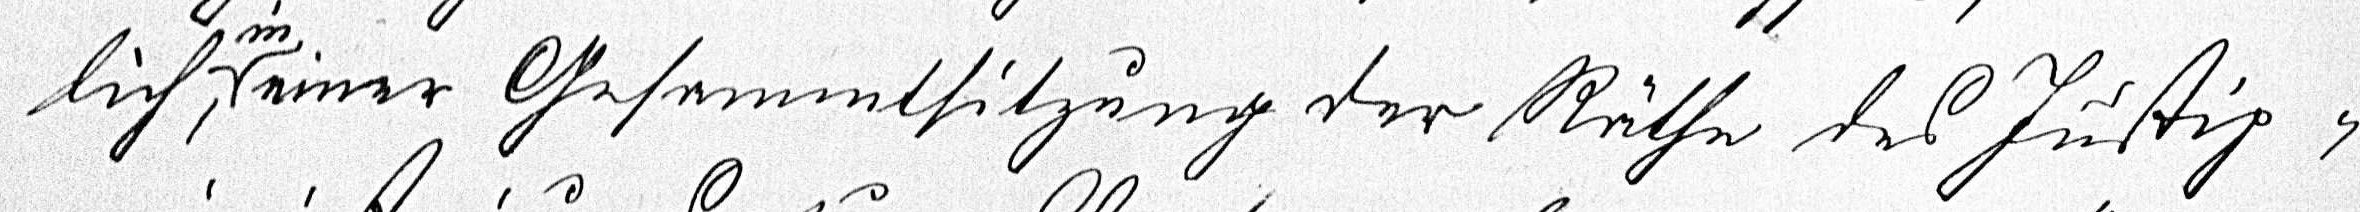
lich, in einer Gesammtsitzung der Räthe des Justiz¬
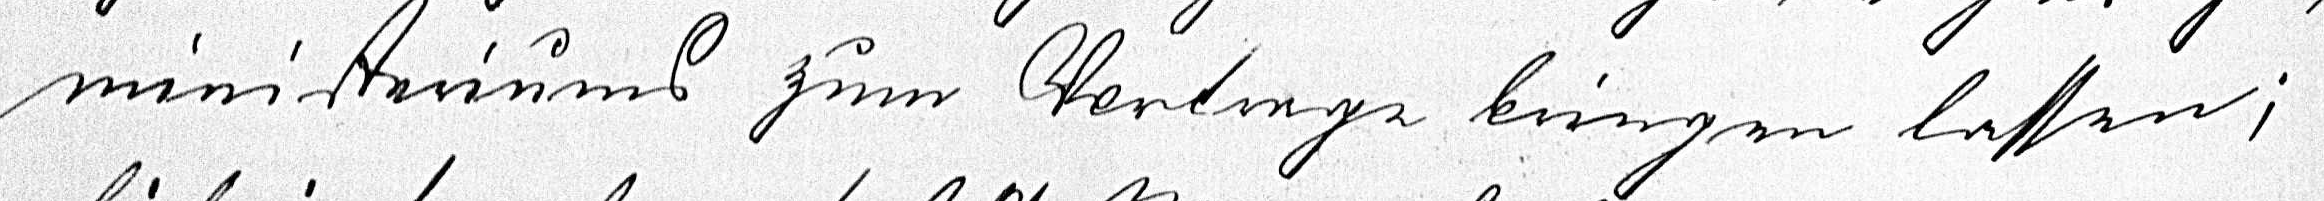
ministeriums zum Vortrage bringen lassen;
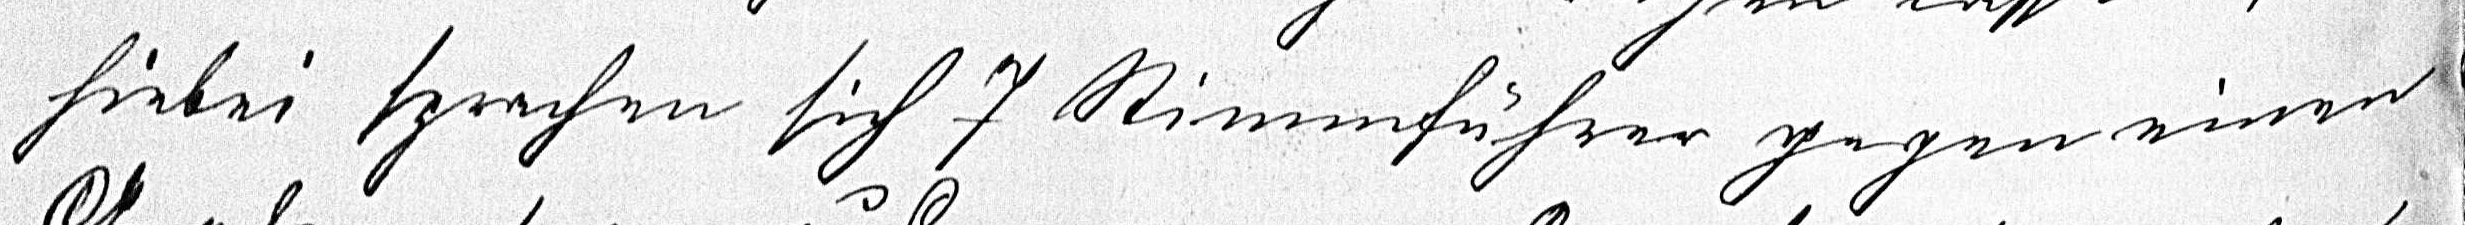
hiebei sprechen sich 7 Stimmführer gegen einen
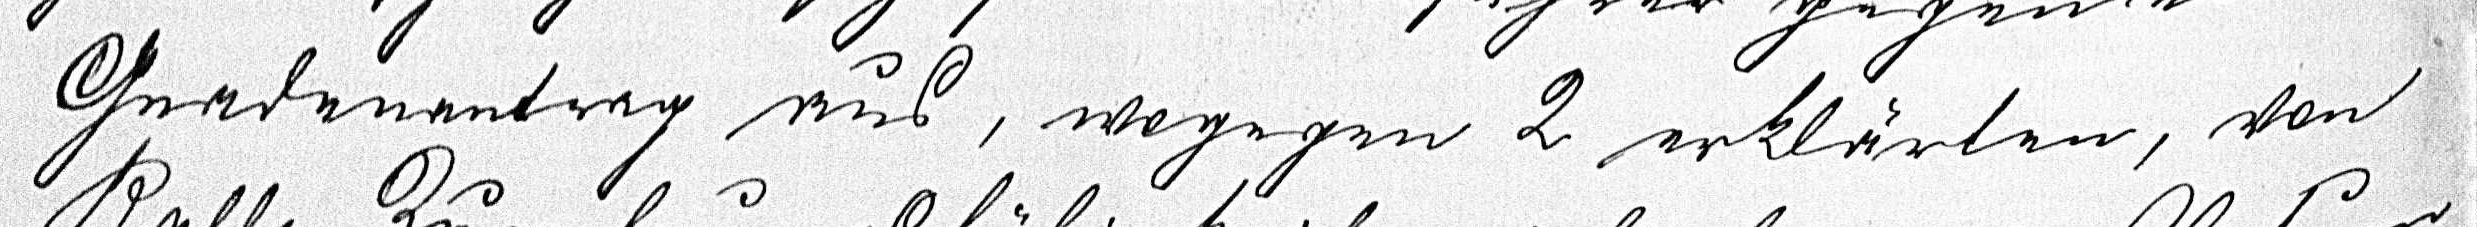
Gnadenantrag aus, wogegen 2 erklärten, von
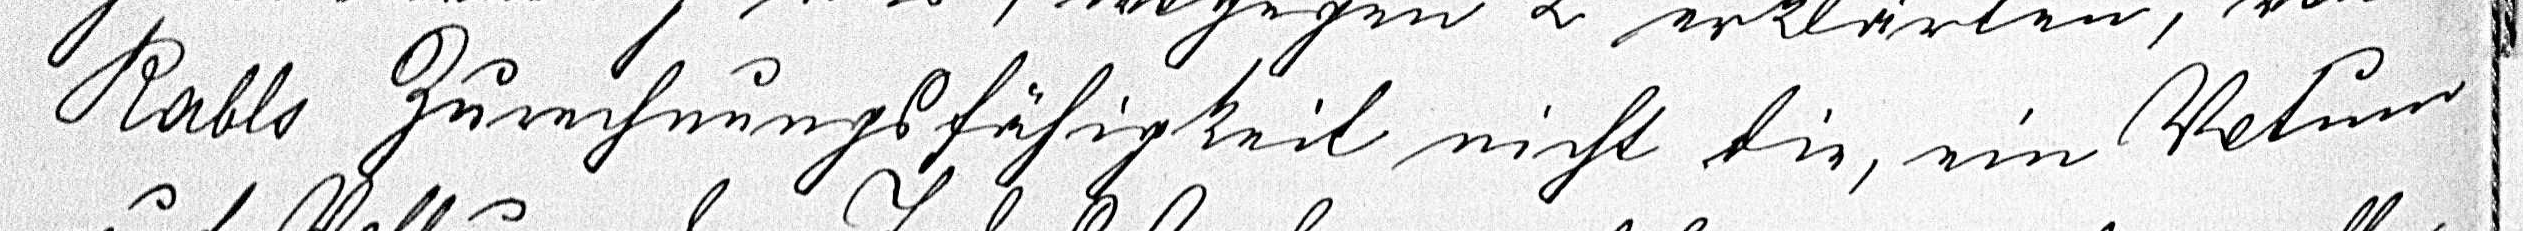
Rabls Zurechnungsfähigkeit nicht die, ein Votum
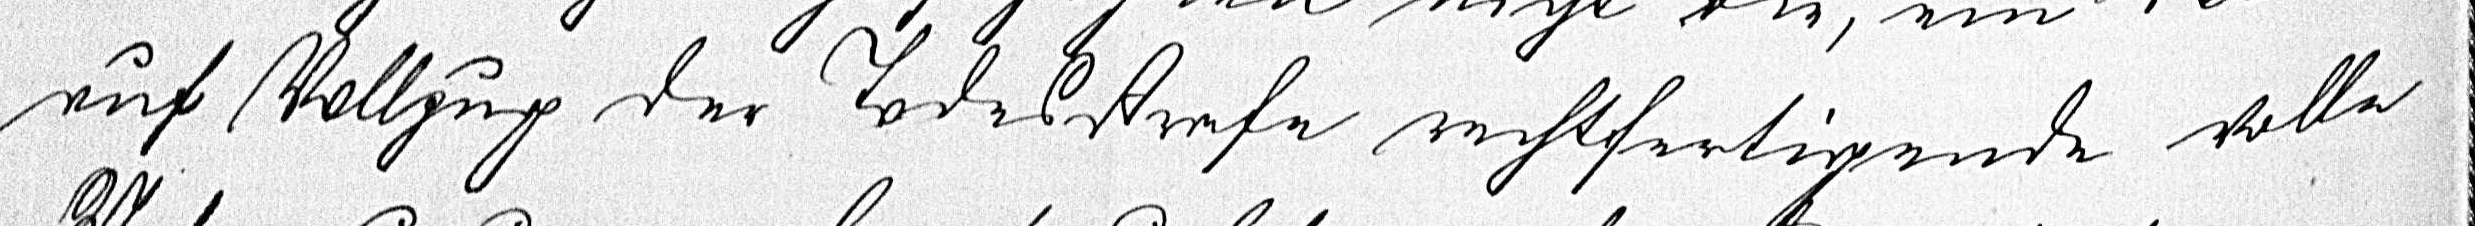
auf Vollzug der Todesstrafe rechtfertigende volle
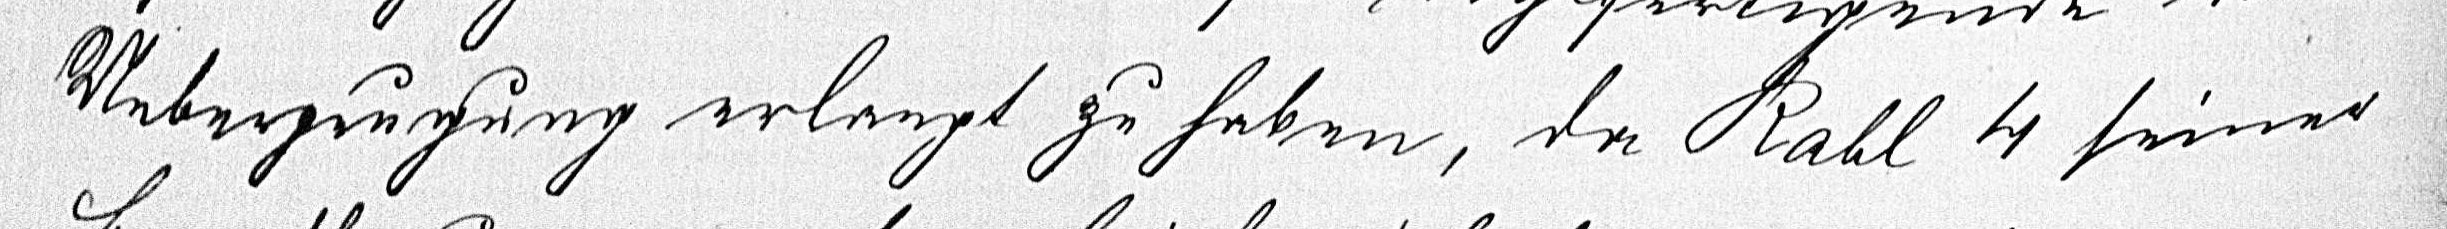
Ueberprugung erlangt zu haben, da Rabl 4seiner
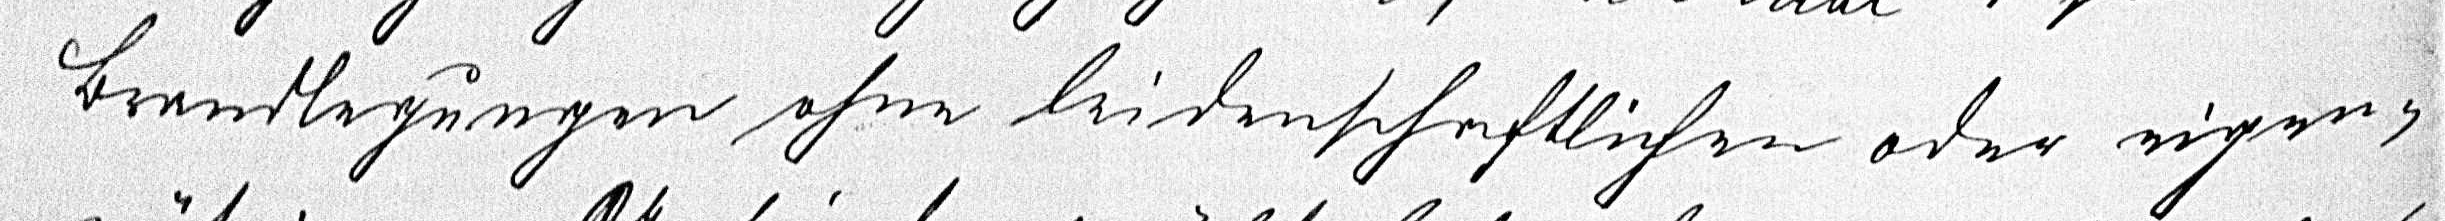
Brandlegungen ohne leidenschaftlichen oder eigen¬
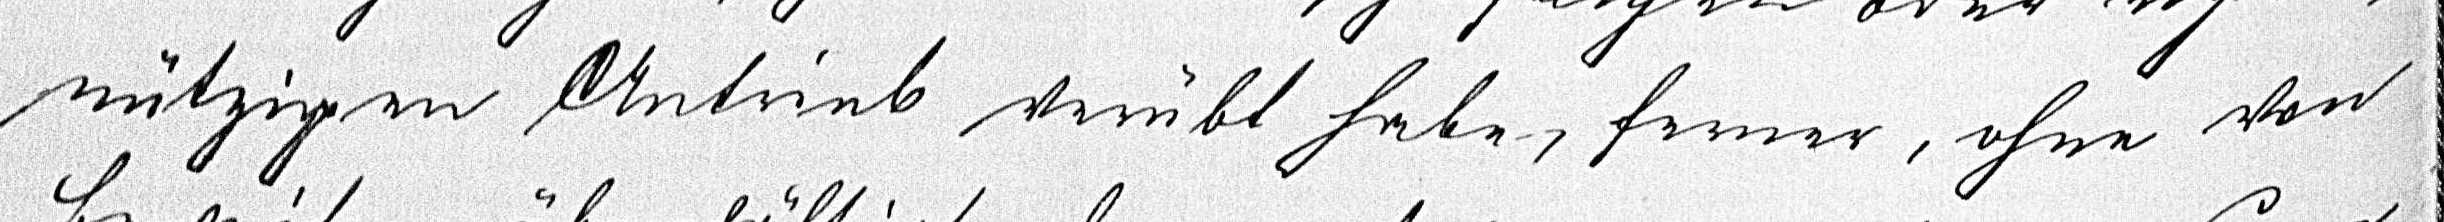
nützigen Antrieb verübt habe, ferner, ohne von
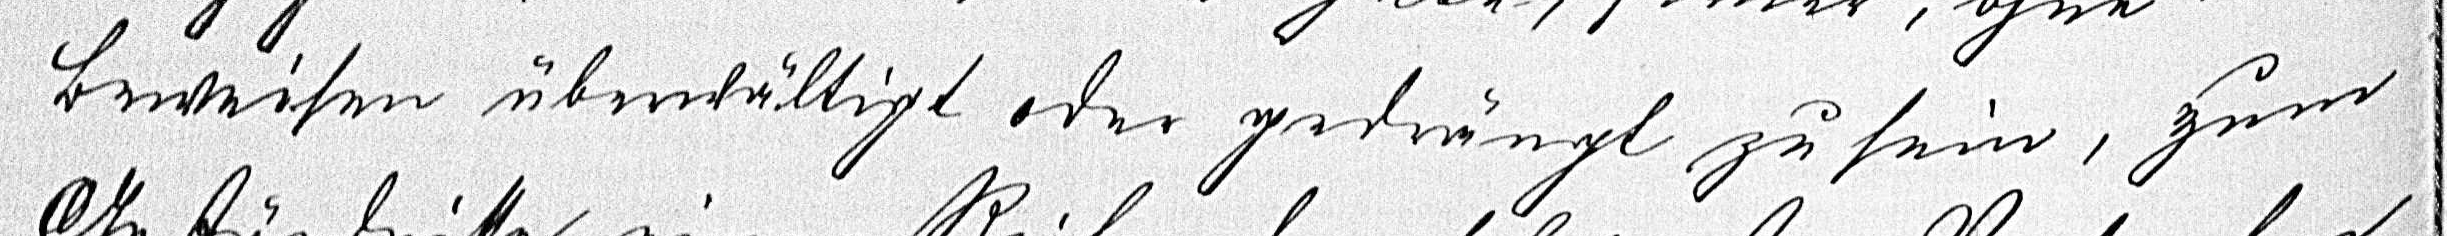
Beweisen überwältigt oder gedrängt zu sein, zum
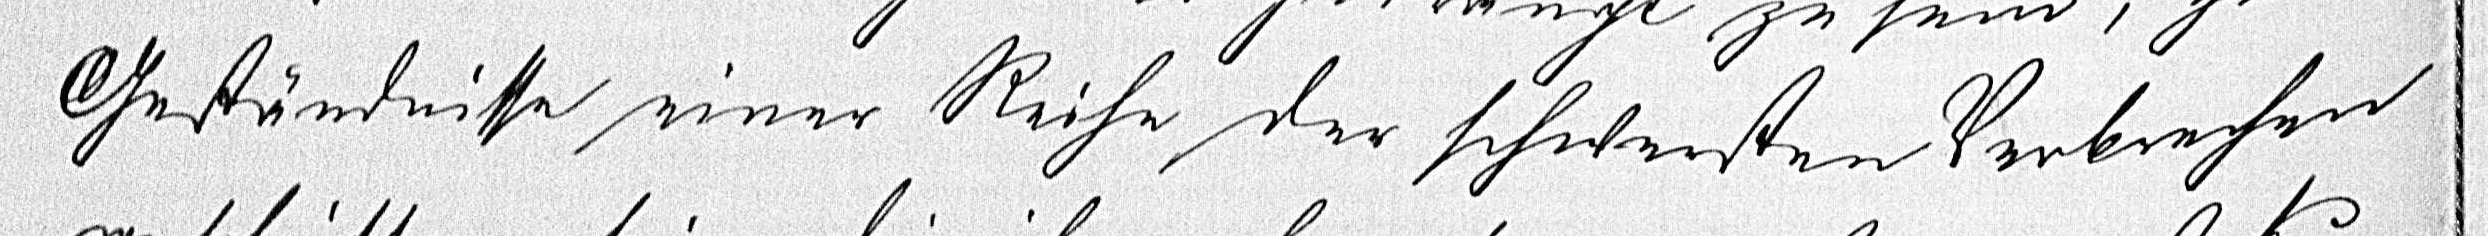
Geständnisse einer Reihe der schwersten Verbrechen
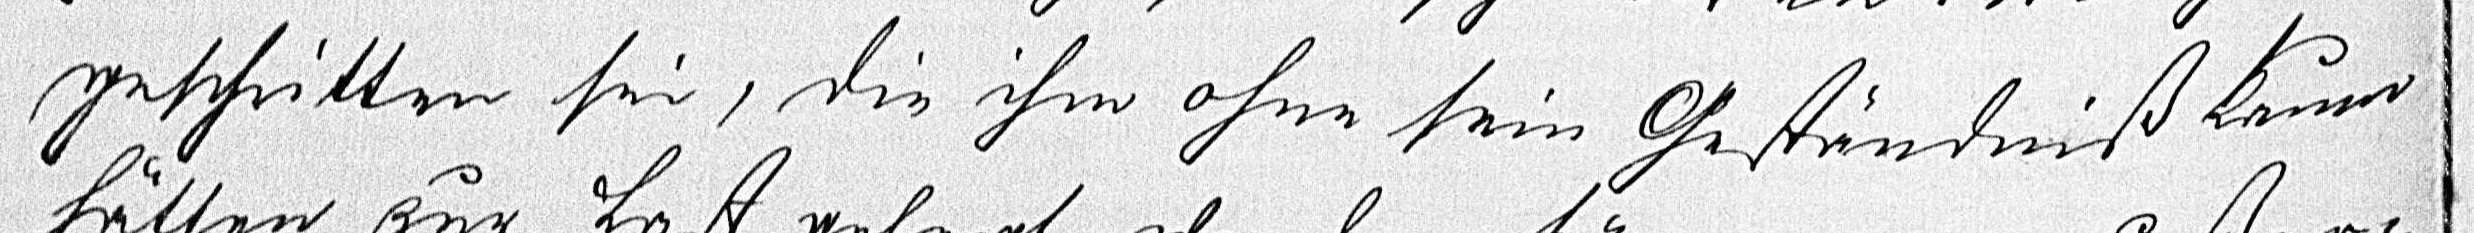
geschritten sei, die ihm ohne sein Geständniß kaum
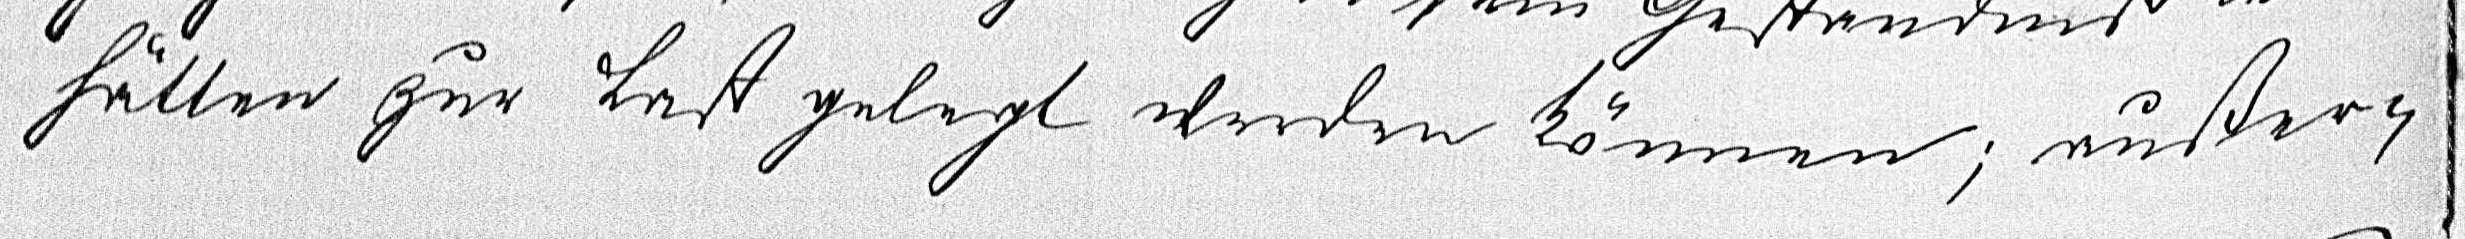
hätten zur Last gelegt werden können; äußer¬
